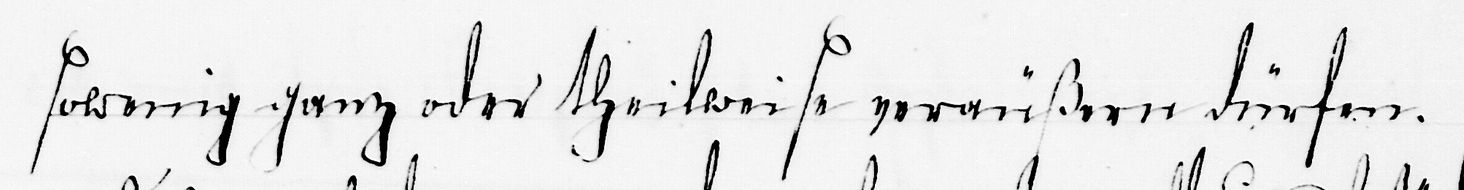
sowenig ganz oder theilweise veräußern dürfen.
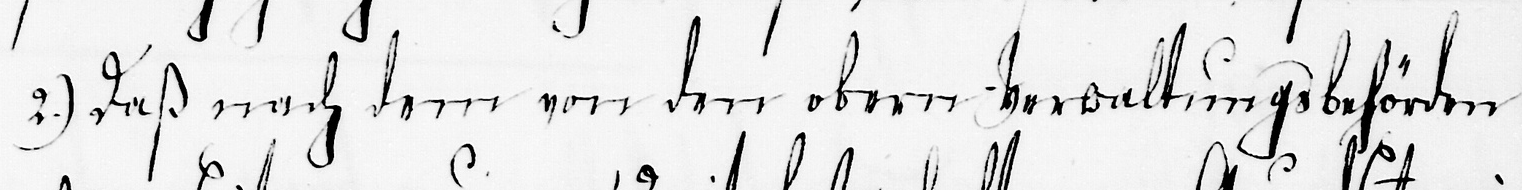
2.) Daß nach dem von den obern Verwaltungsbehörden
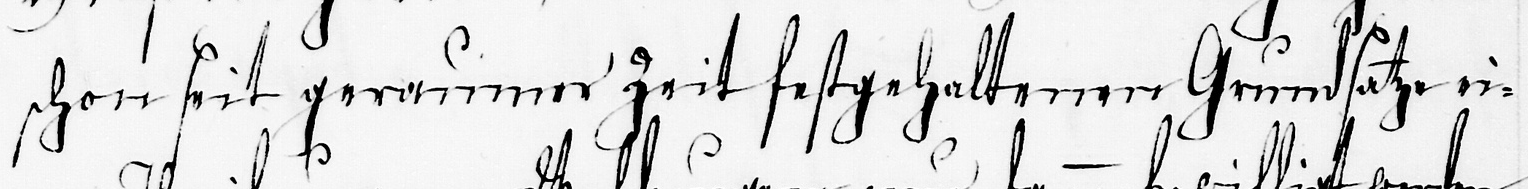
schon seit geraumer Zeit festgehaltenen Grundsatze ei¬
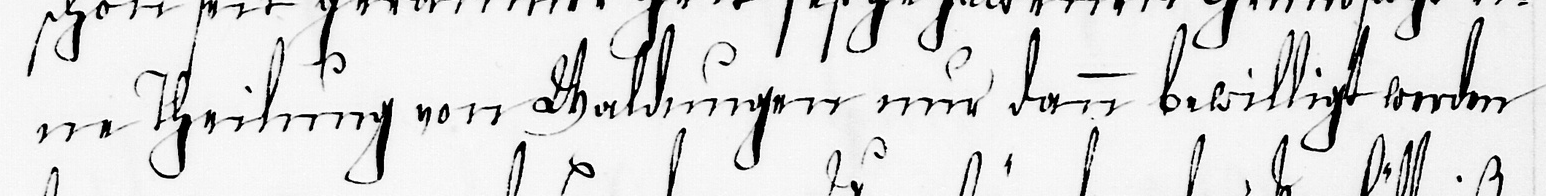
ne Theilung von Waldungen nur dann bewilligt werden
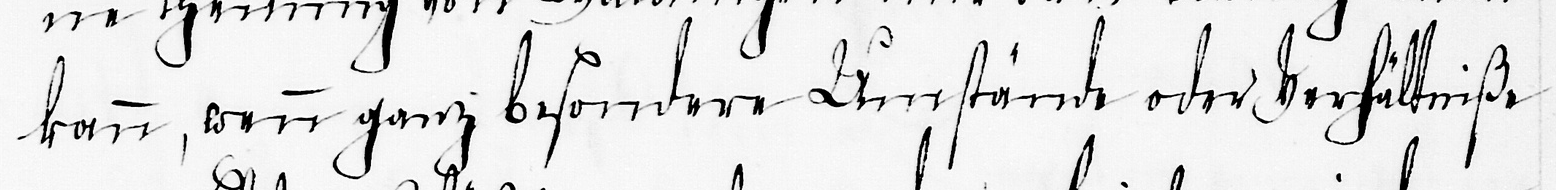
kann, wenn ganz besondere Umstände oder Verhältniße
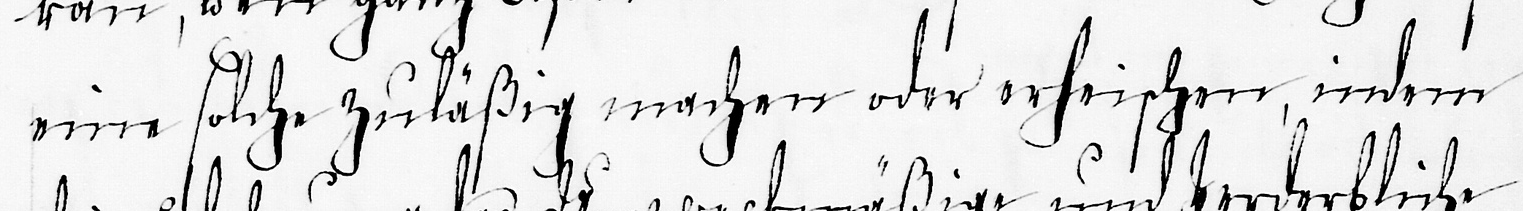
eine solche zuläßig machen oder erheischen, indem
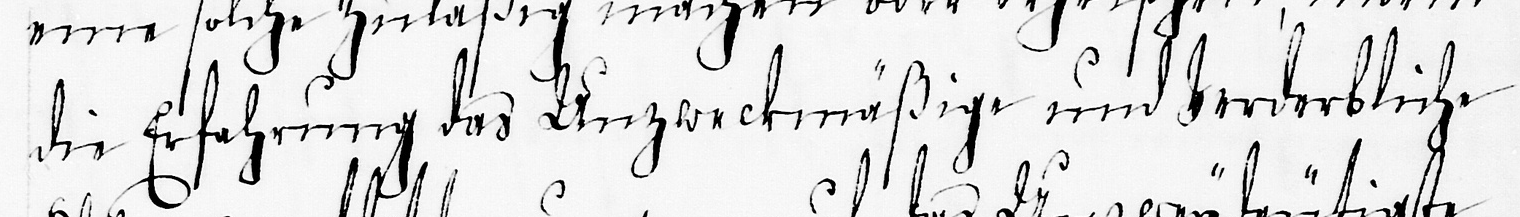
die Erfahrung das Unzweckmäßige und Verderbliche
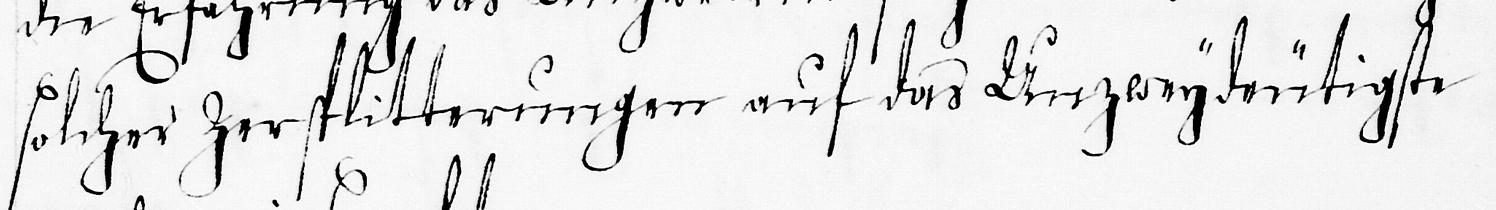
solcher Zersplitterungen auf das Unzweydeutigste
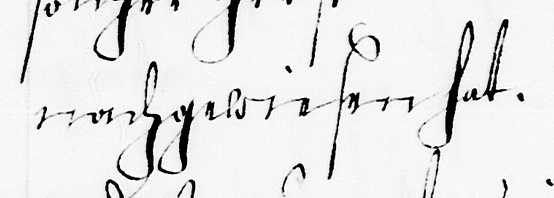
nachgewiesen hat.
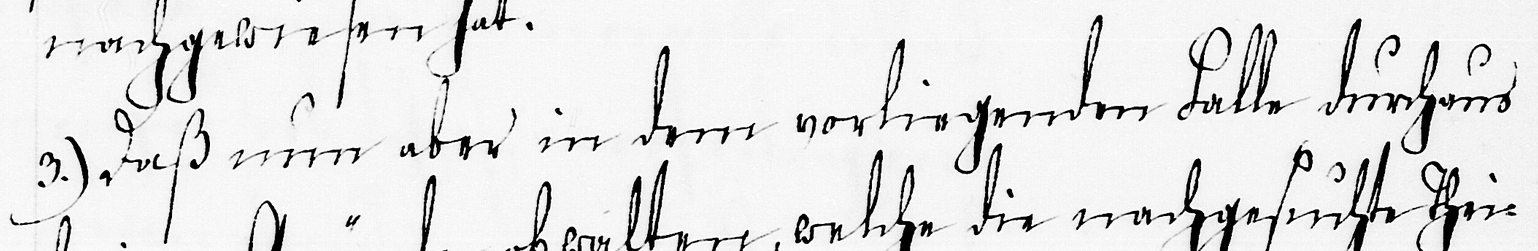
3.) Daß nun aber in dem vorliegenden Falle durchaus
